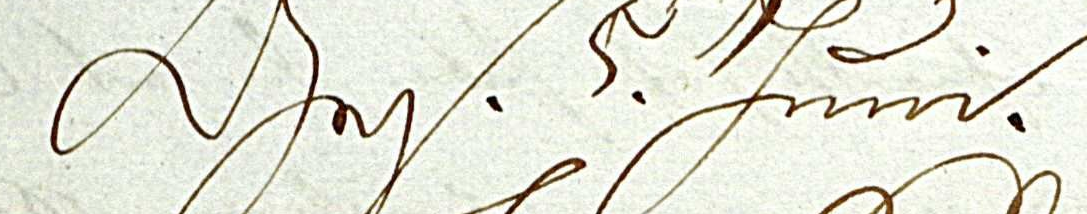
Ges. 5. Juni,
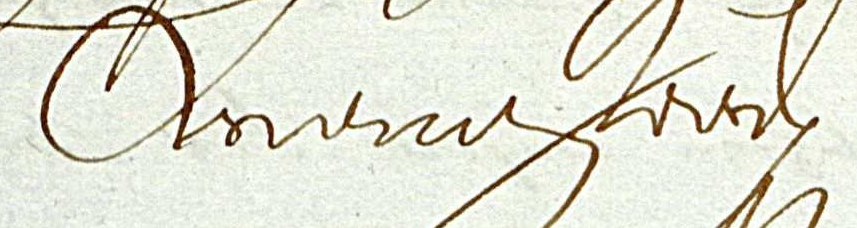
Franz Karl,
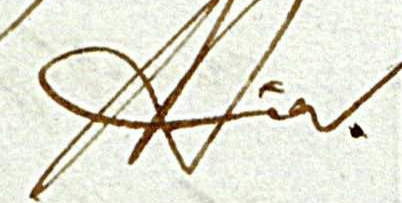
Wien
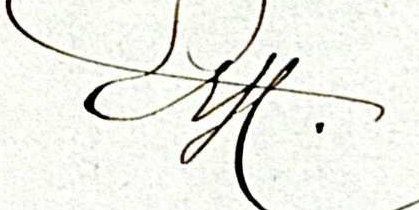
AhE
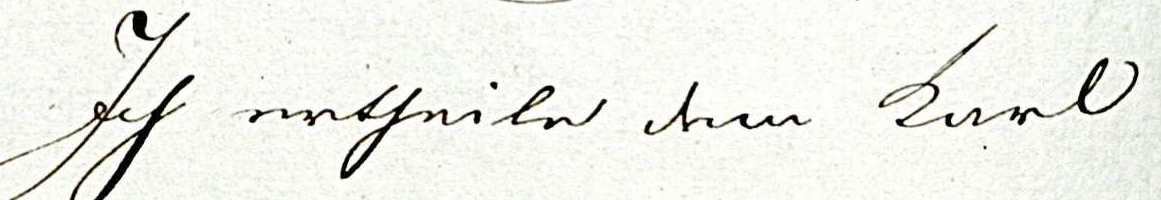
Ich ertheile dem Karl
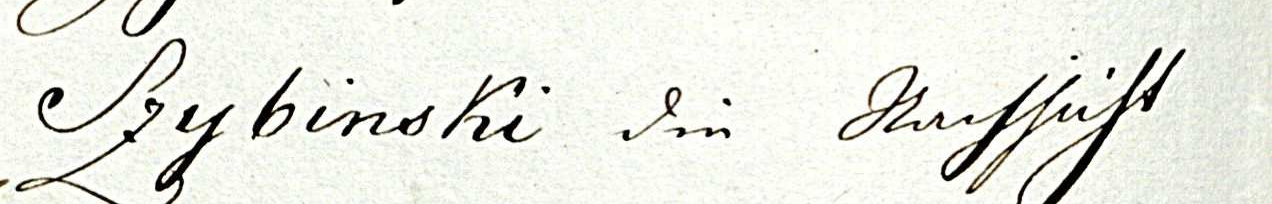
Szybinski die Nachsicht
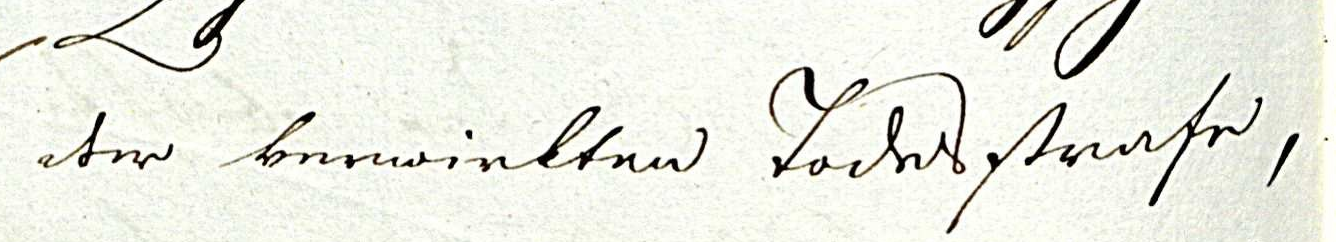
der verwirkten Todesstrafe,
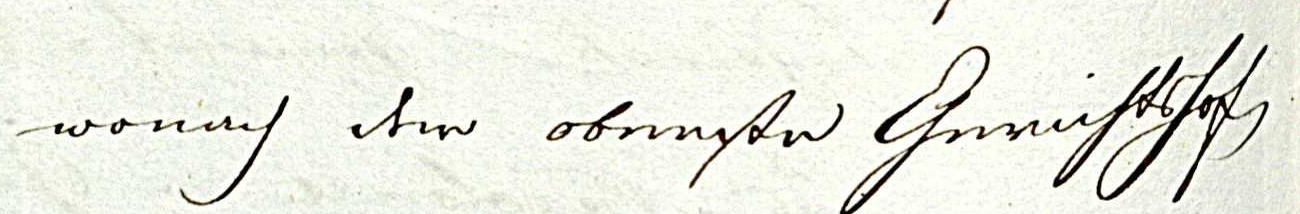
wonach der oberste Gerichtshof
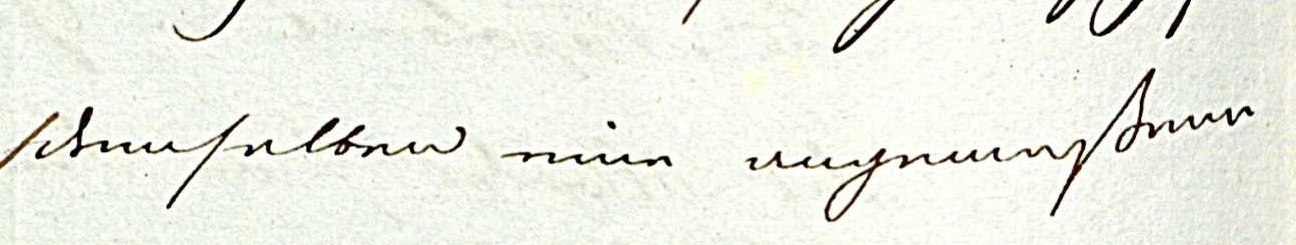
demselben eine angemeßene
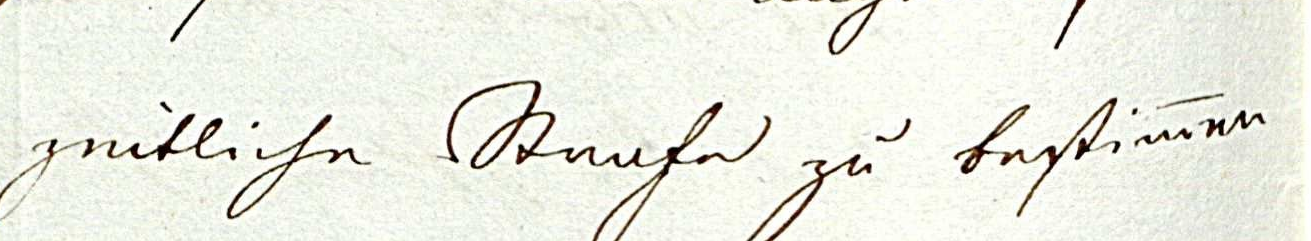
zeitliche Strafe zu bestimmen
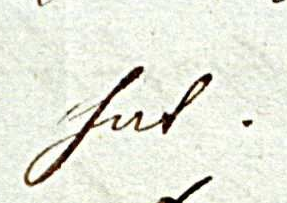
hat.
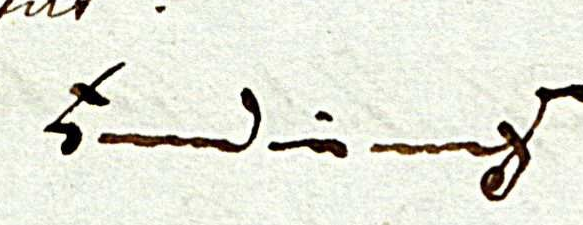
Ferdinand
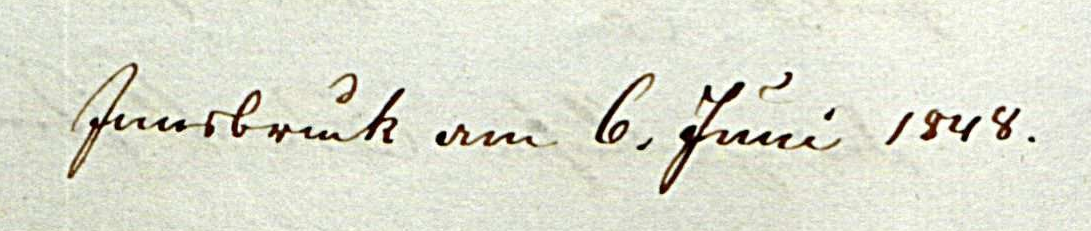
Innsbruck am 6. Juni 1848
